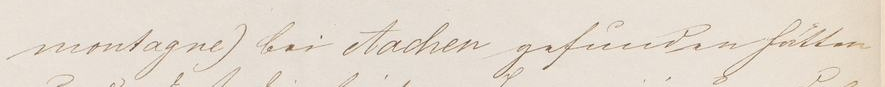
montagne) bei Aachen gefunden hätten
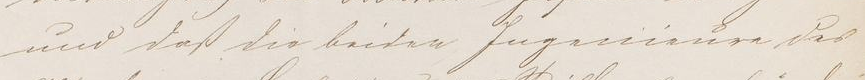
und daß die beiden Ingenieure des
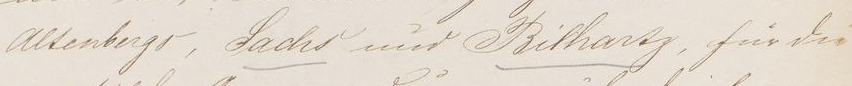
Altenbergs, Sachs und Bilhartz, für die
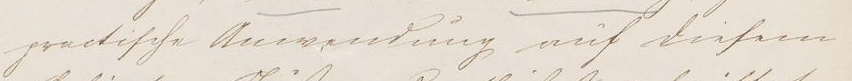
practische Anwendung auf diesem
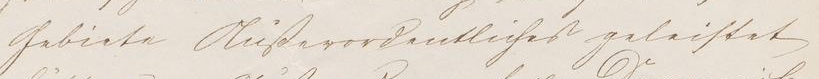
Gebiete Außerordentliches geleistet
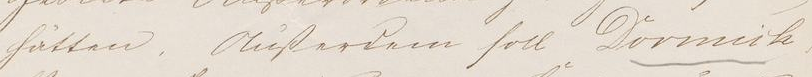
hätten. Außerdem soll Dormick,
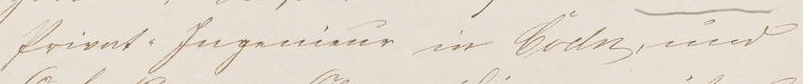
Privat-Ingenieur in Coeln, und
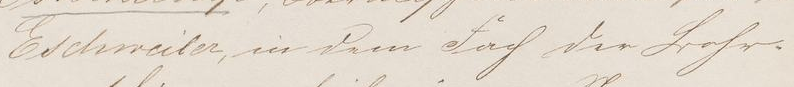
Eschweiler, in dem Fach der Bohr-
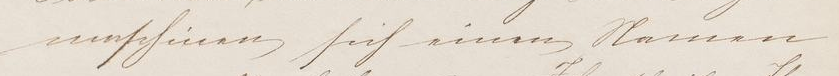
maschinen sich einen Namen
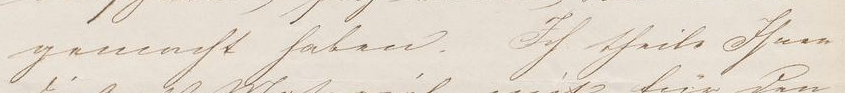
gemacht haben. Ich theile Ihnen
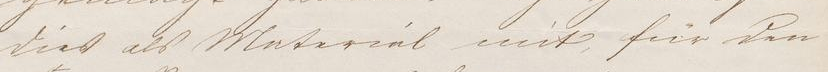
dies als Material mit, für den
